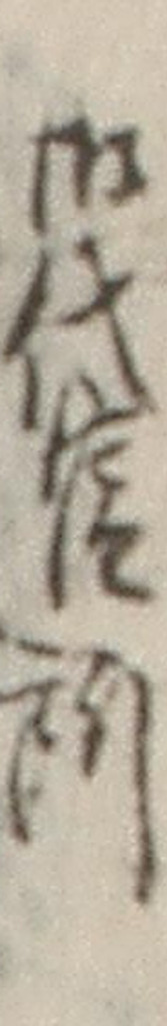御代官所
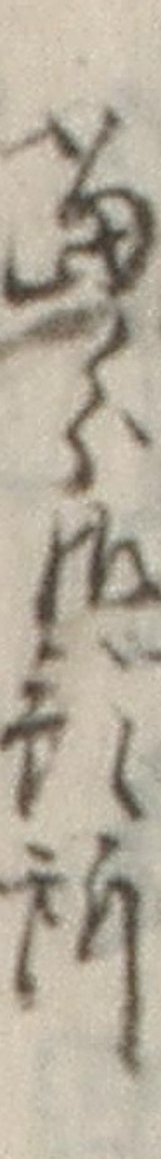当分御預所
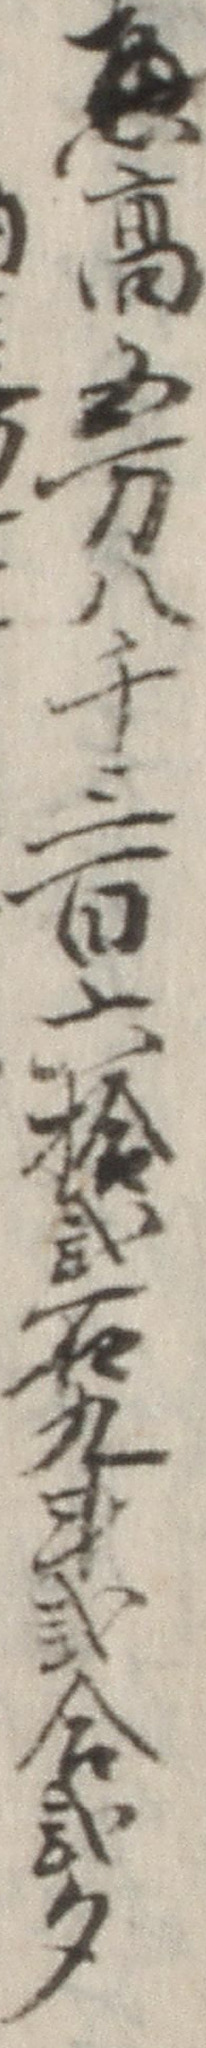惣高五万八千三百六拾弐石九斗弐合弐夕
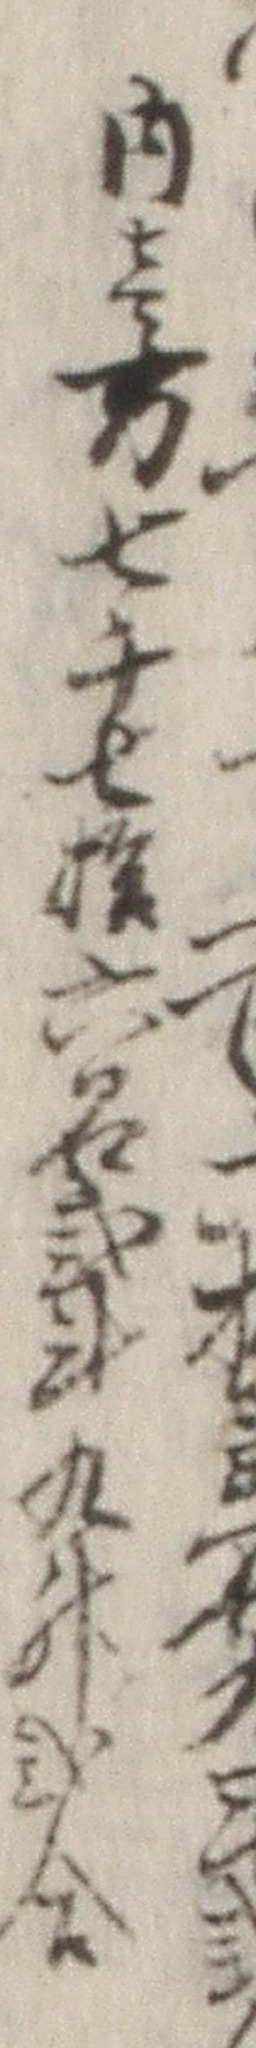内壱万七千七拾六石弐斗九升弐合
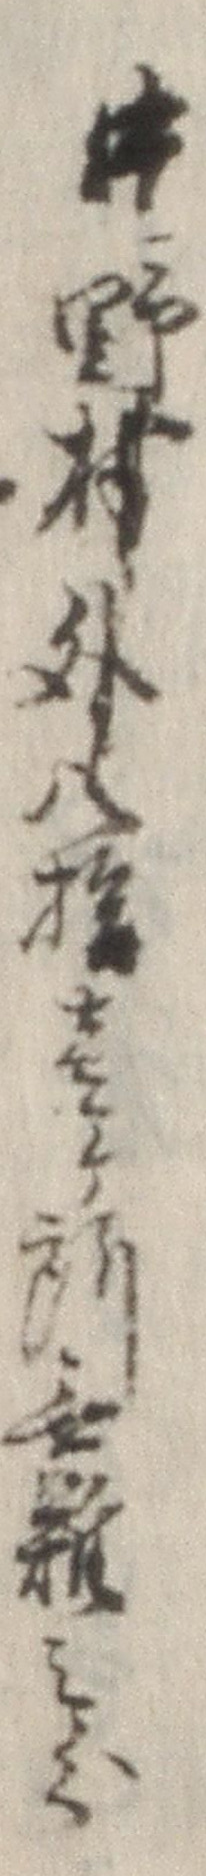中野村外八拾壱ケ所無難之分
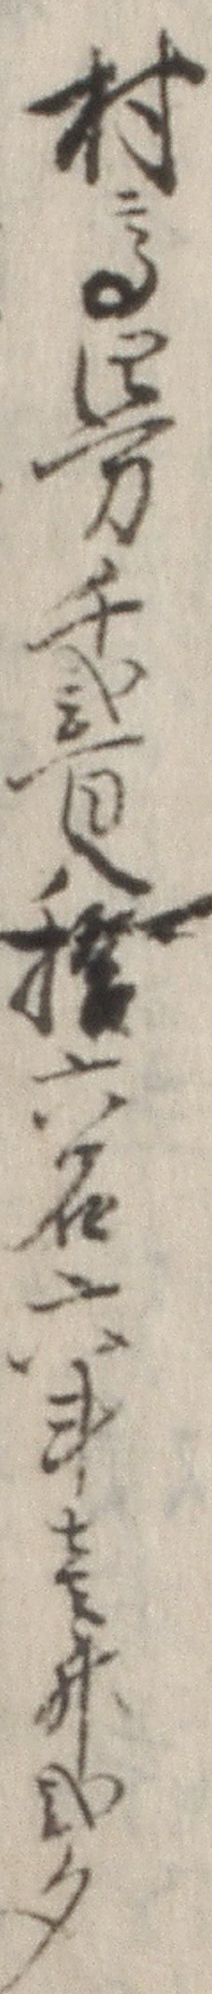村高四万千弐百八拾六石六斗壱升弐夕
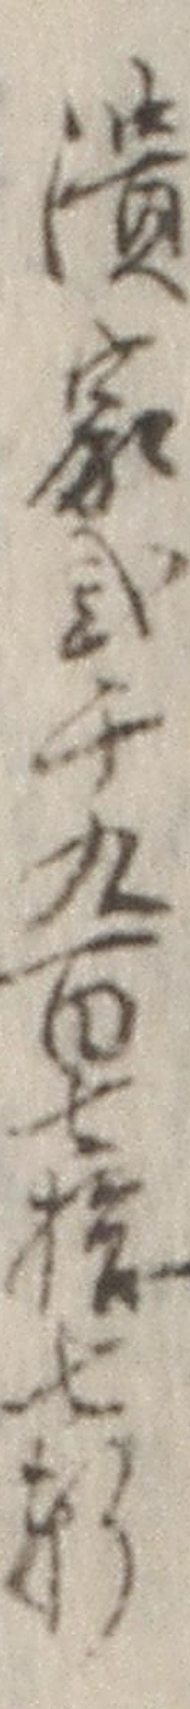潰家弐千九百七拾七軒
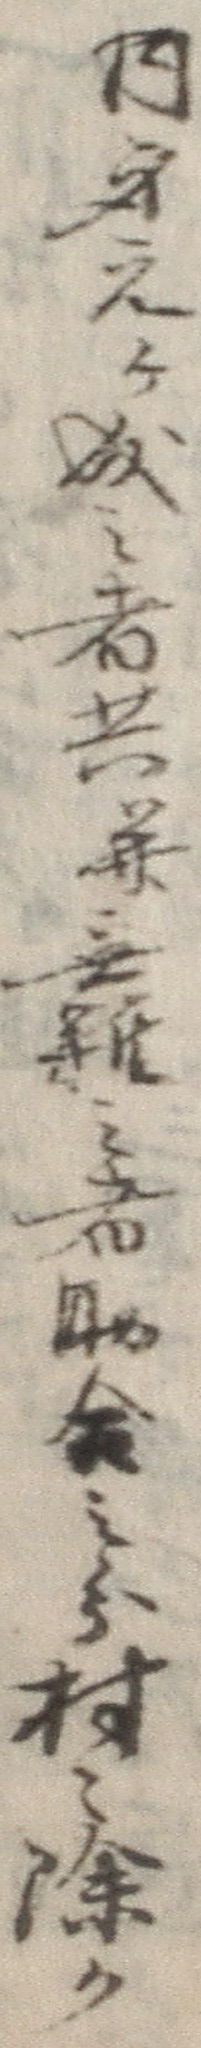内身元之ケ成之者共并無難之者助合之分村々除ク
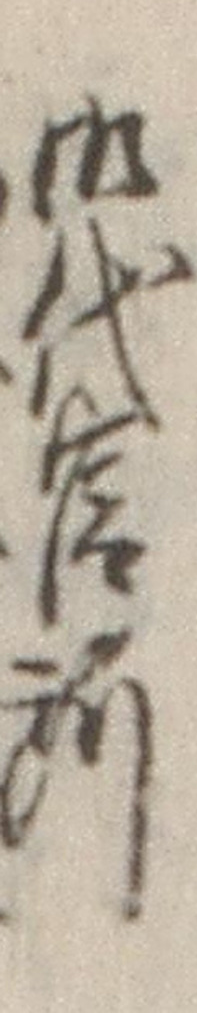御代官所
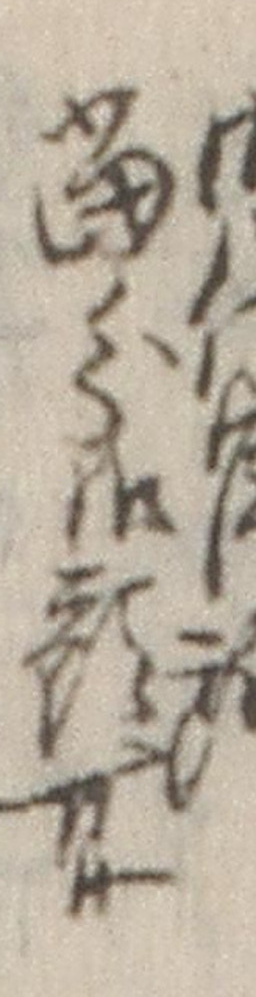当分御預所
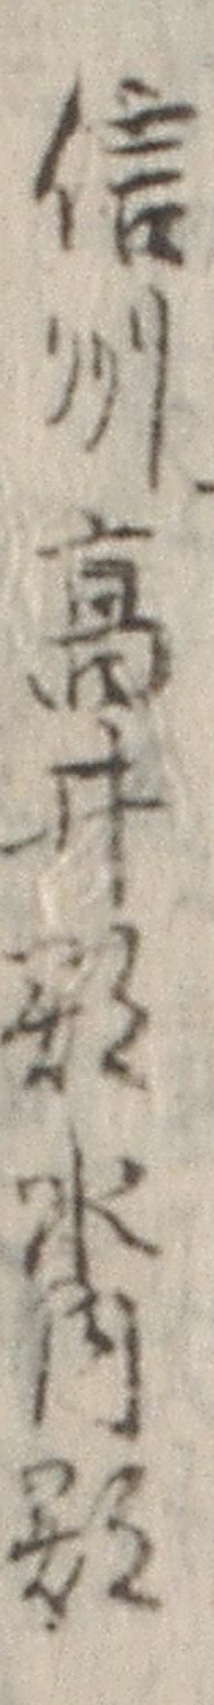信州高井郡水内郡
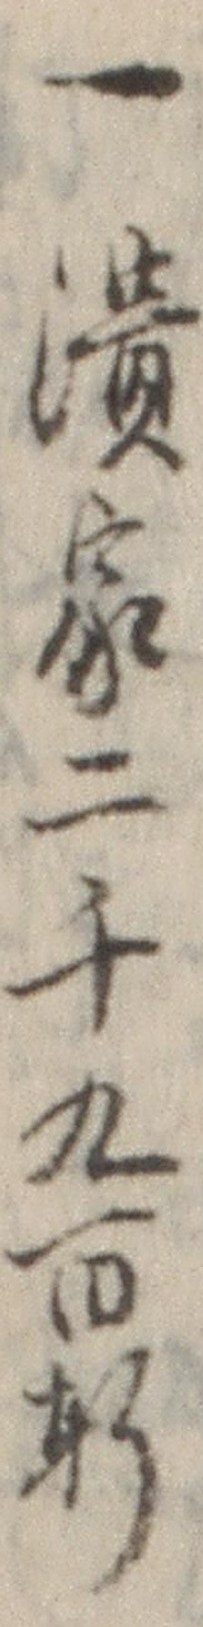一潰家二千九百軒
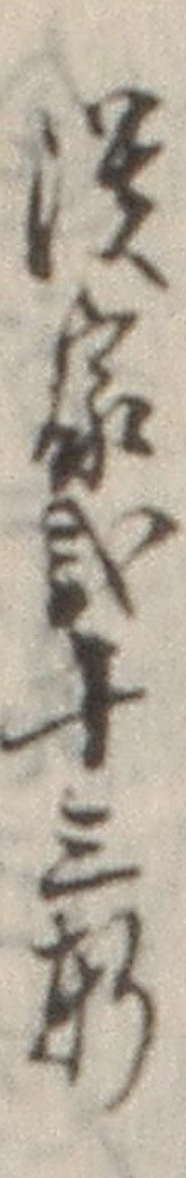潰家弐千三軒
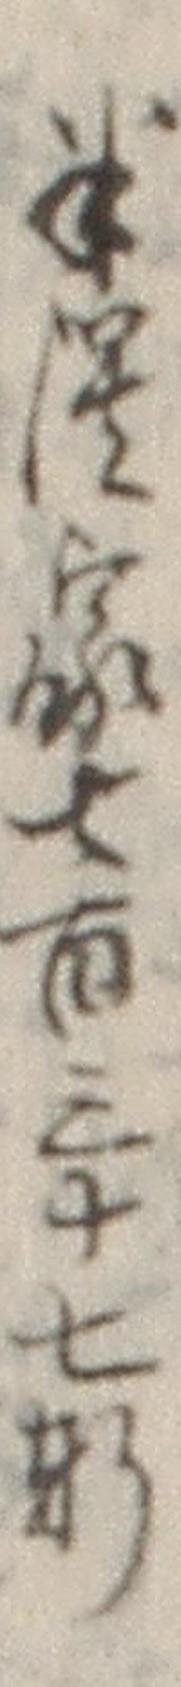半潰家七百三十七軒
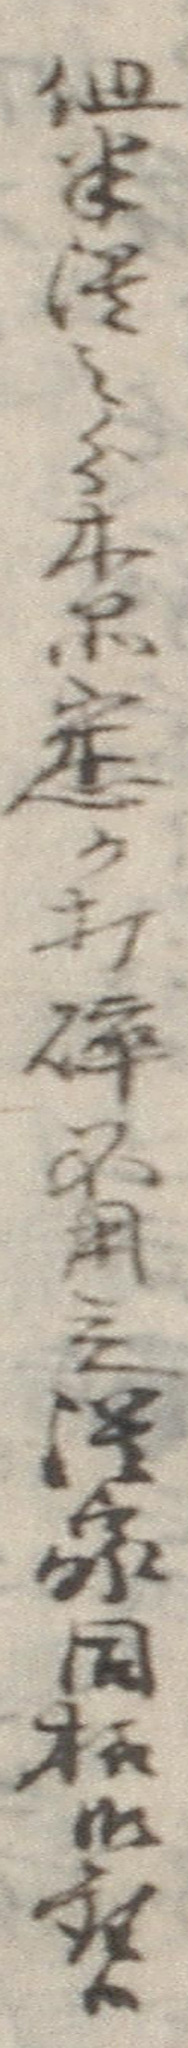但半潰家之分木品悉ク打砕不用之潰家同様御取候
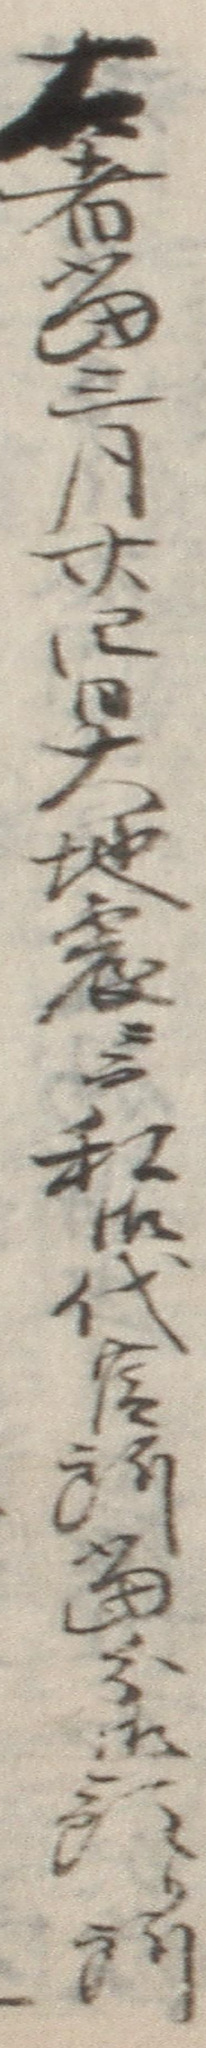右は当三月廿四日大地震ニ而私御代官所当分御預所
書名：[善光寺地震に関する冊子]
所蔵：東京大学地震研究所図書室 Earthquake Research Institute Library, The University of Tokyo, JAPAN
